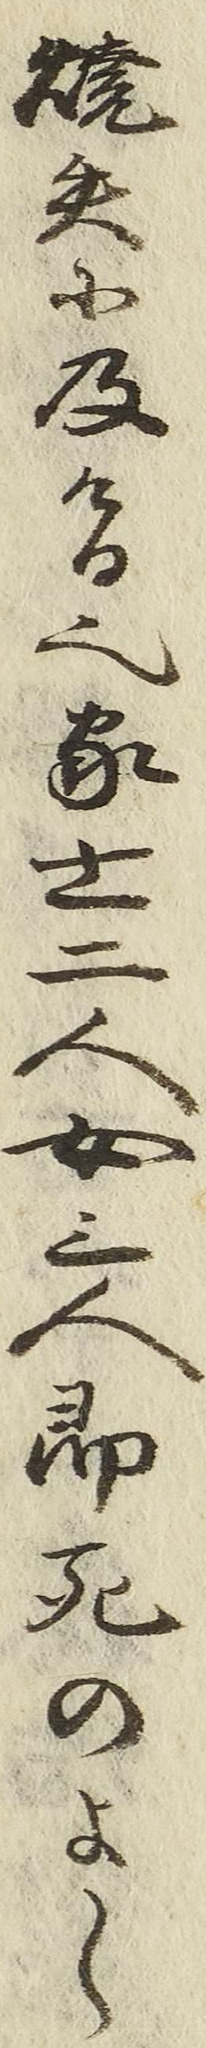焼失に及ける也家士二人女三人即死のよし

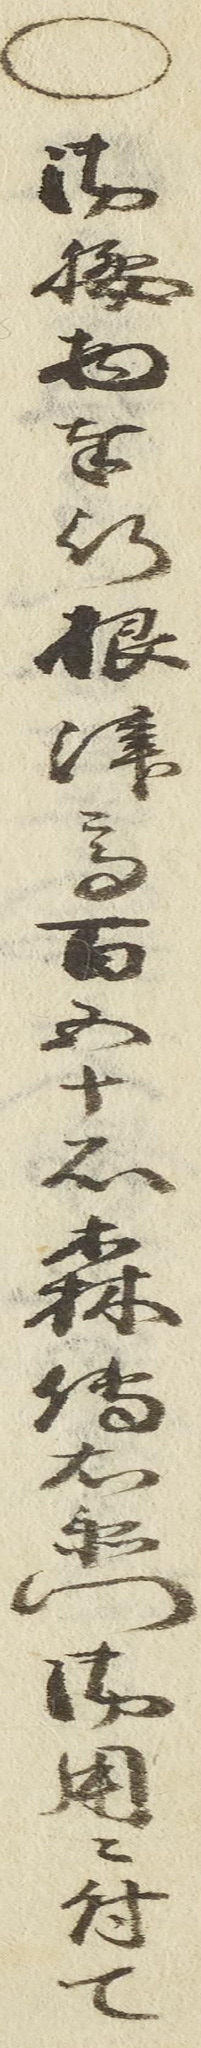○御腰物奉行根津高百五十石森伝右衛門御用ニ付て
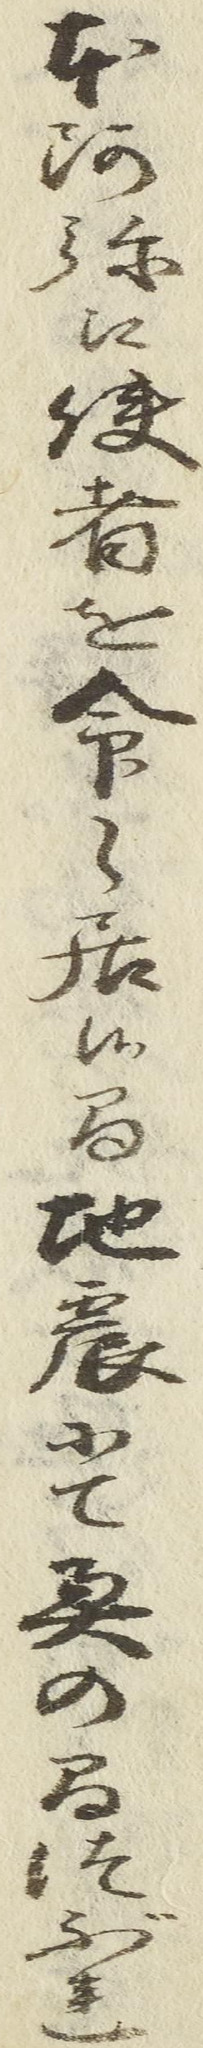本阿弥江使者を命し居候間地震にて奥の間つぶれ
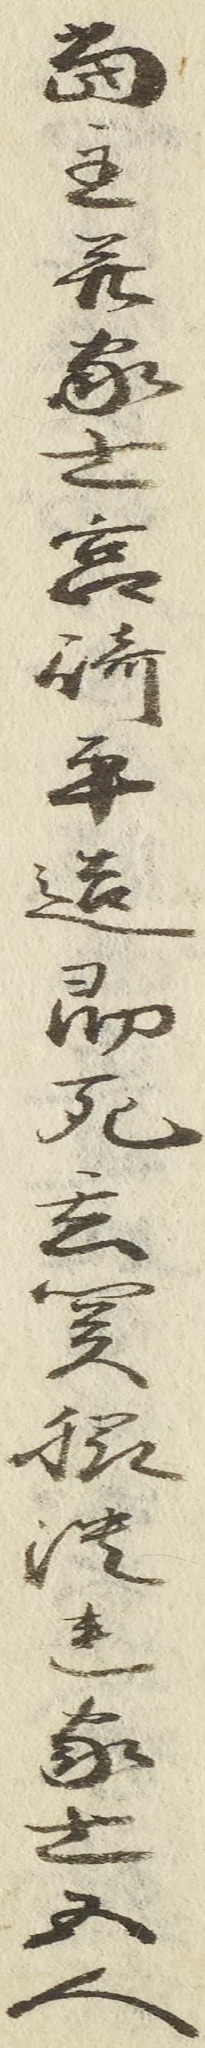当主幷家士宮崎平造即死玄関脇潰れ家士五人
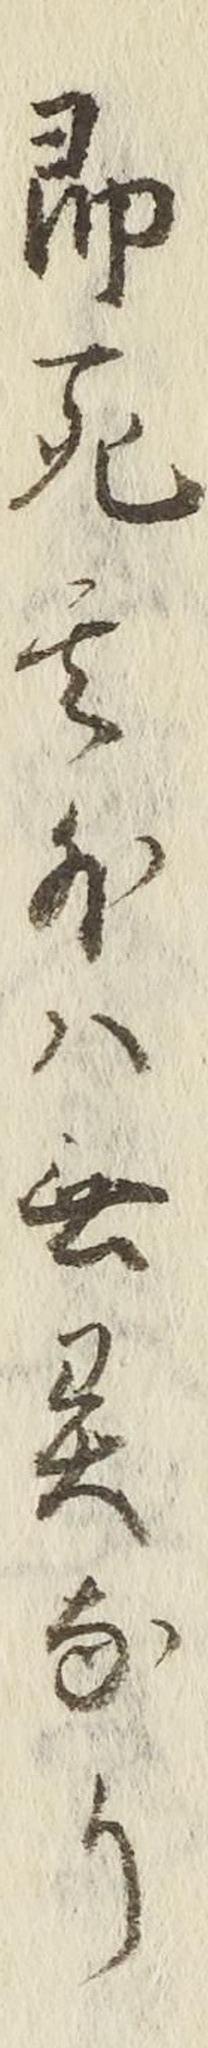即死其外は無異なり
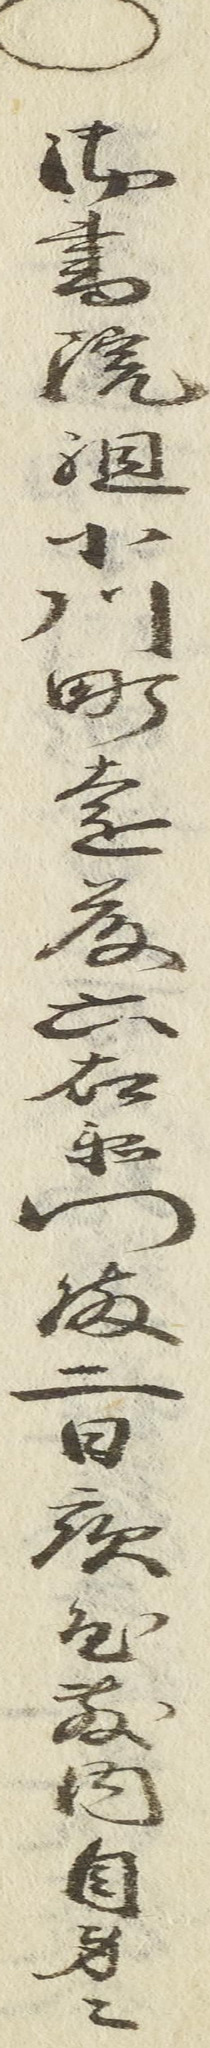○御書院組小川町遠藤六右衛門殿二日夜屋敷内自身ニ
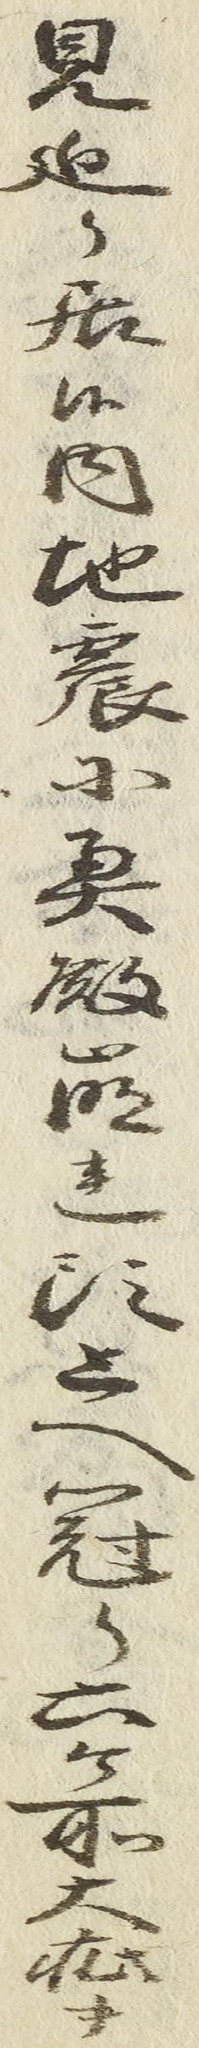見廻り居候内地震に奥殿崩れ頭上へ冠り六ケ所大疵ヲ
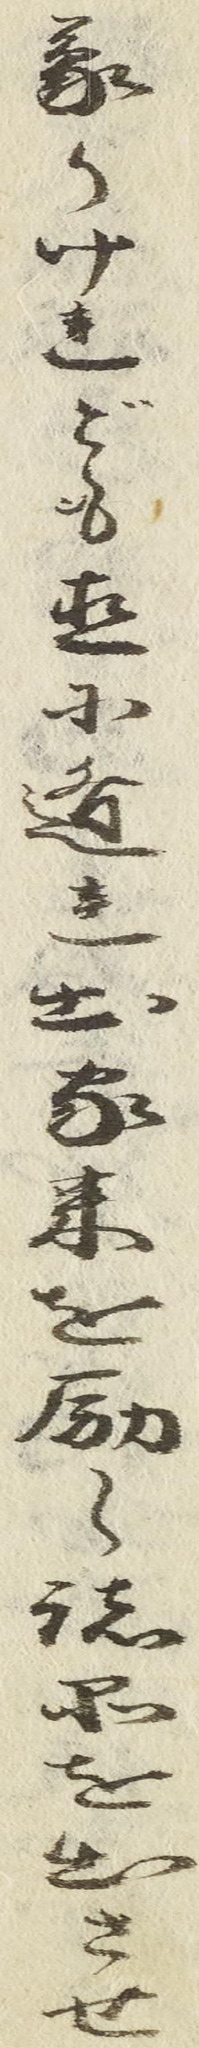蒙りけれども直に遁れ出家来を励し諸品を出させ
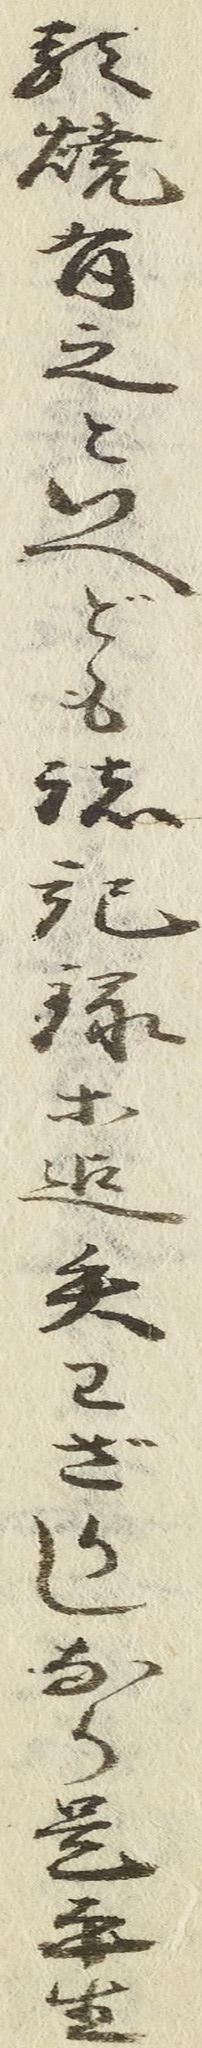類焼有之といへども諸記録等迄失わざりしなり是平生
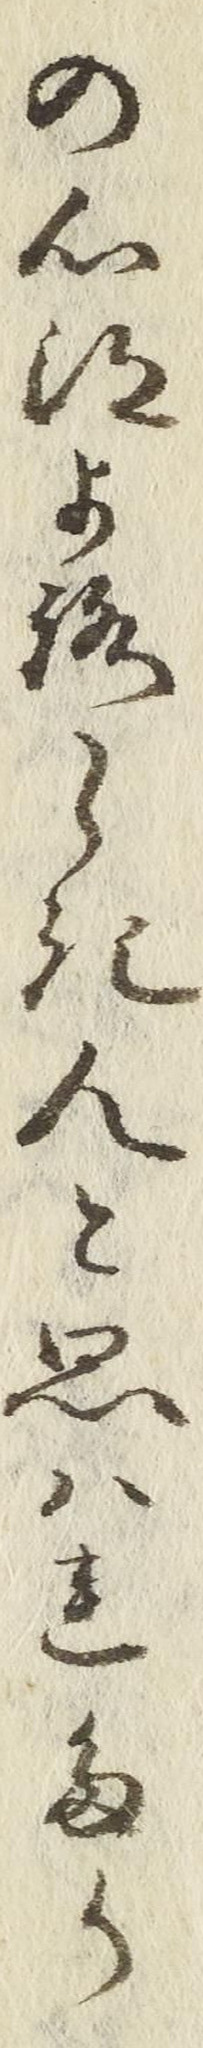の心得よろしき人と思はれたり
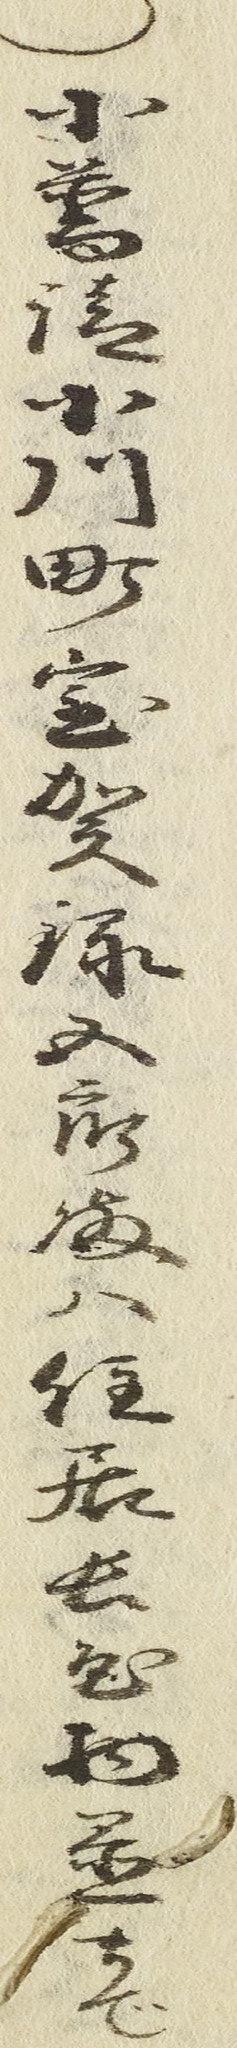○小普請小川町室賀録五郎殿は住居長屋物置まで
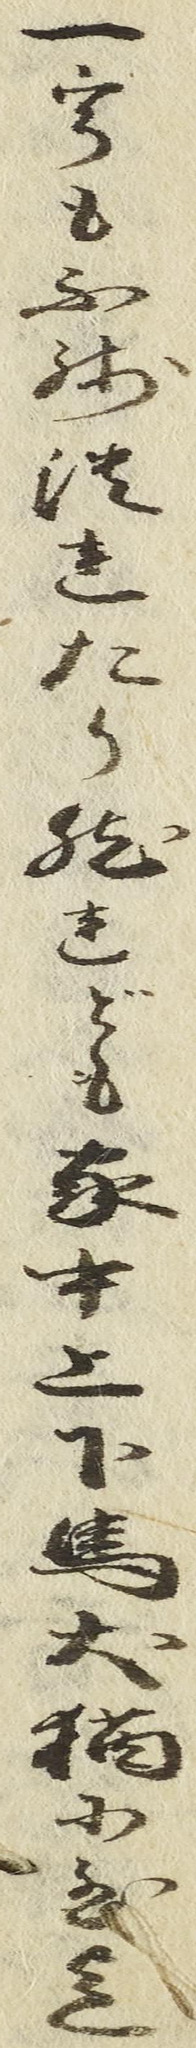一宇も不残潰れたり然れども家中上下馬犬猫に至迄
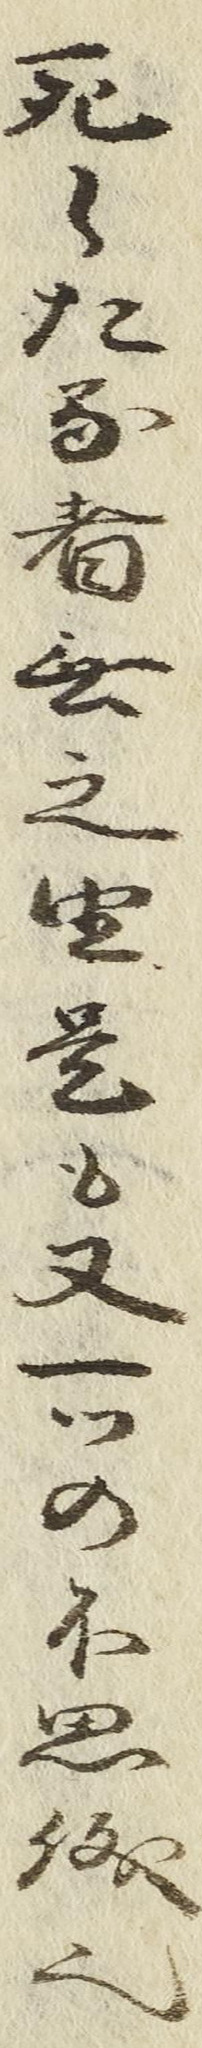死したる者無之由是も又一ツの不思儀也
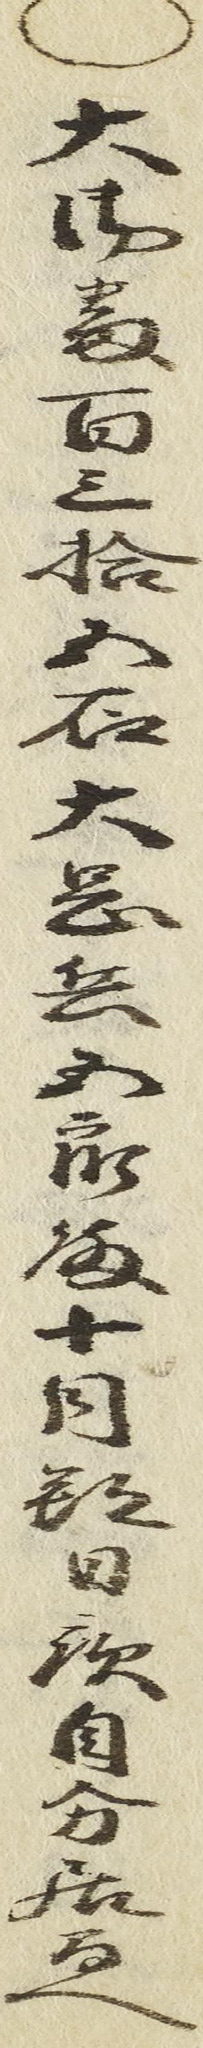○大御番百三拾五石大岡兵五郎殿十月朔日夜自分居間へ
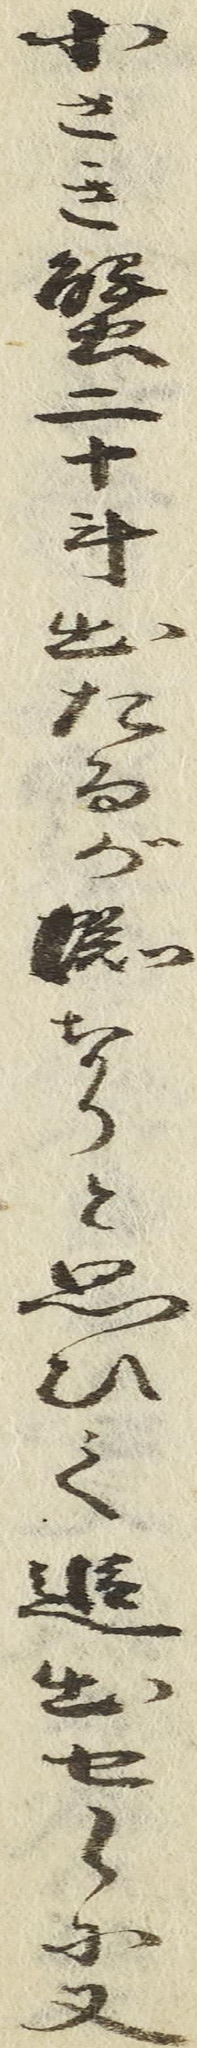小さき蟹二十計出たるが蜘なりと思ひて追出せしに又
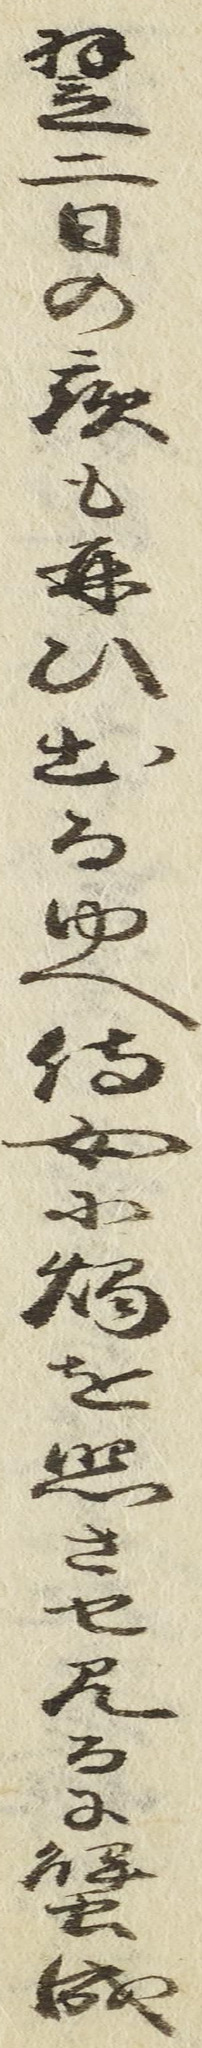翌二日の夜も再ひ出るゆへ侍女に燭を照させ見るに蟹成
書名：安政二年震災記事　完
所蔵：東京大学地震研究所図書室 Earthquake Research Institute Library, The University of Tokyo, JAPAN
